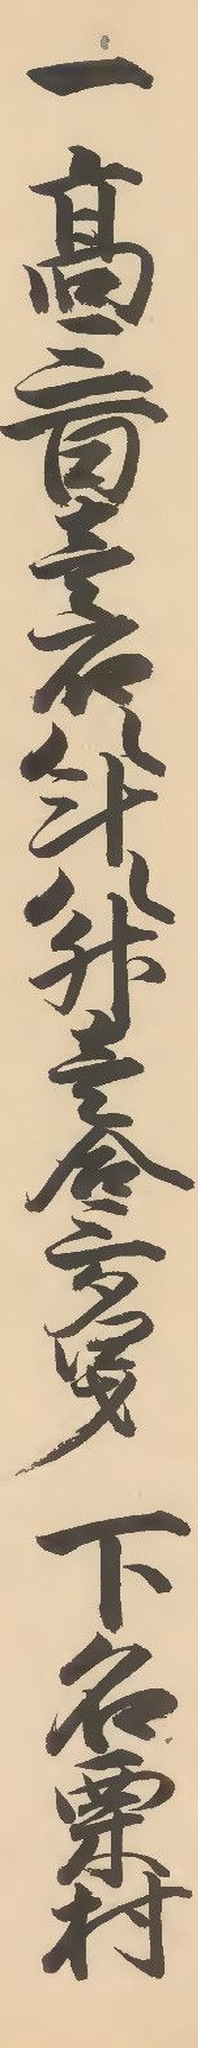一高二百壱石八斗八升壱合三勺四才下名栗村
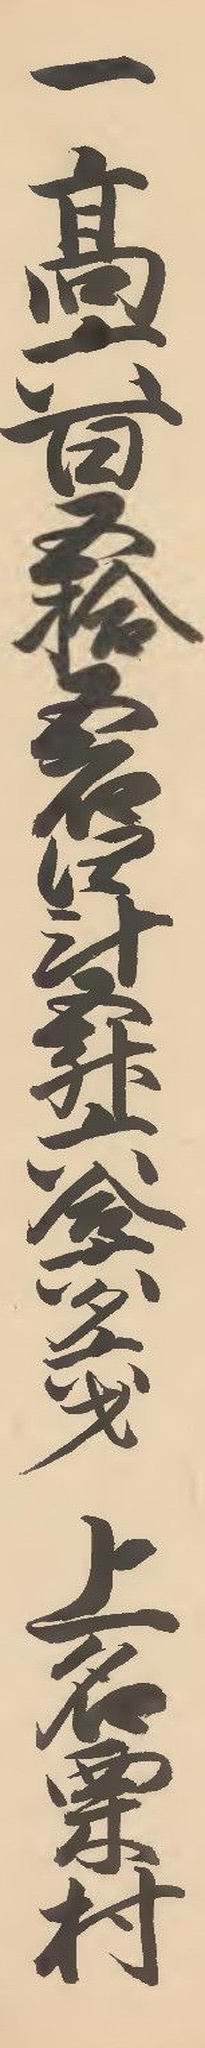一高六百五拾五石四斗五升六合六勺六才上名栗村
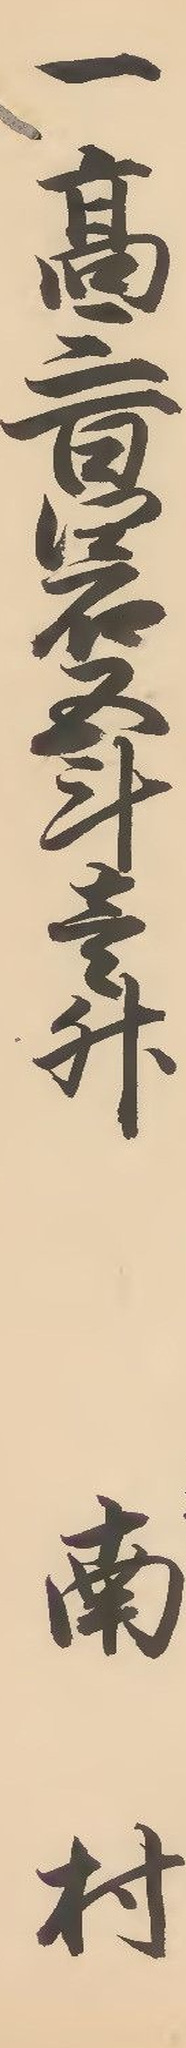一高三百四石五斗壱升南村

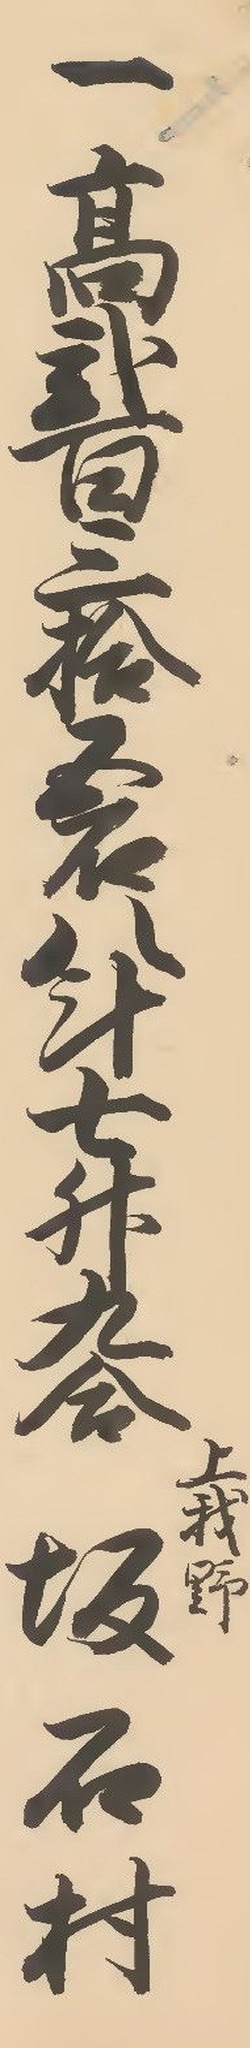一高弐百三拾五石八斗七升九合坂石村
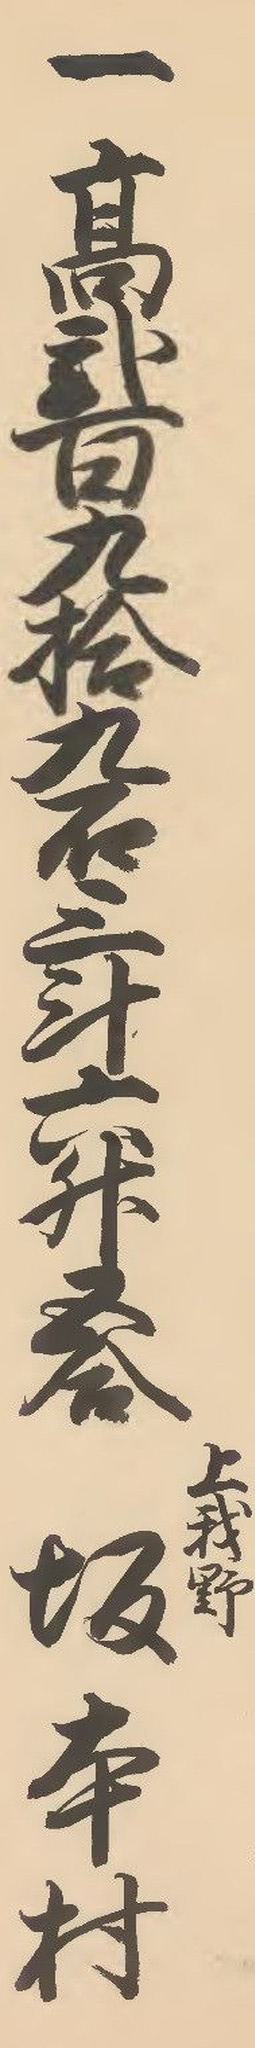一高弐百九拾九石三斗六升五合坂本村
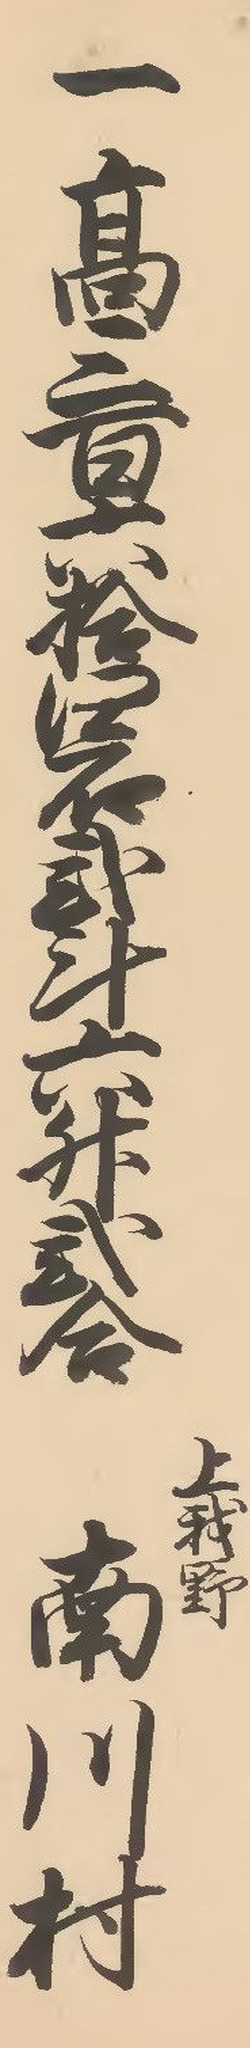一高三百六捨四石弐斗六升弐合南川村
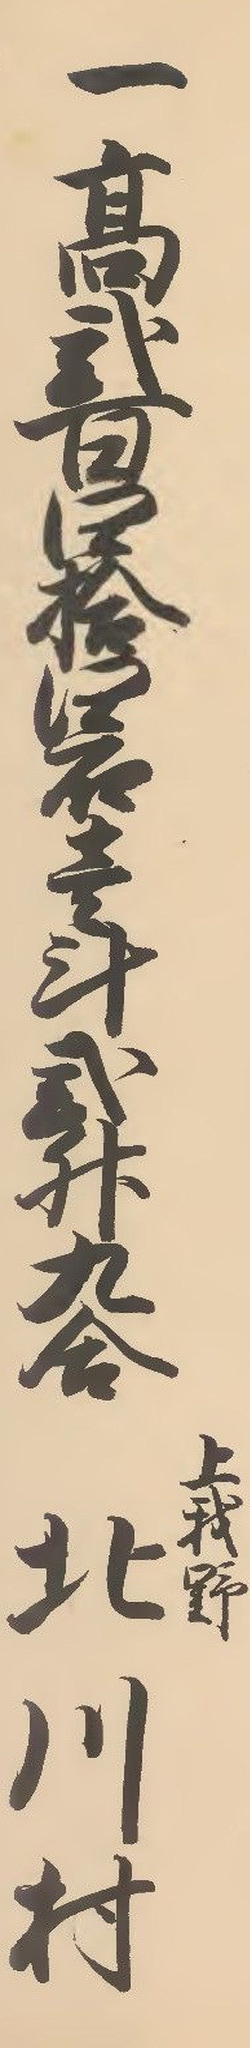一高弐百四拾四石壱斗弐升九合北川村
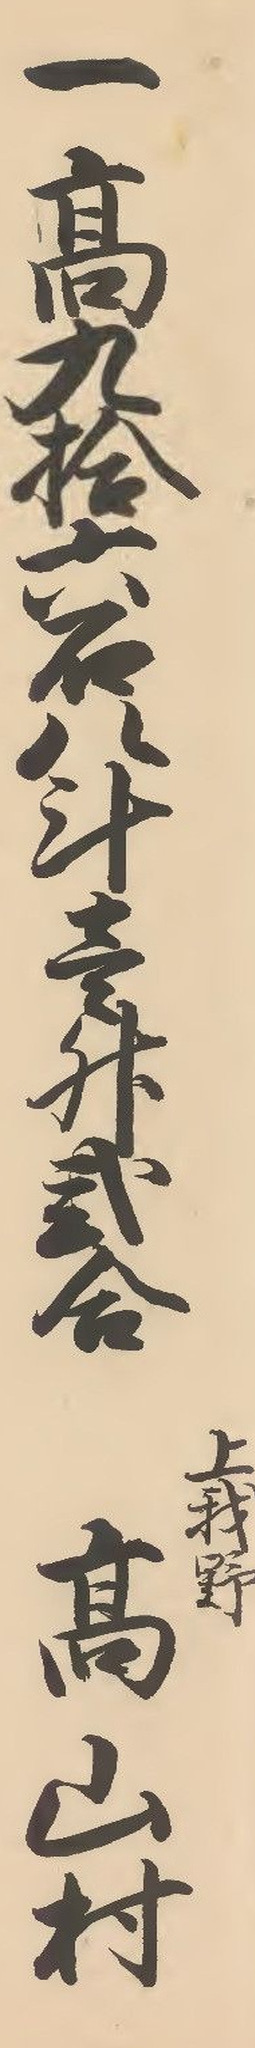一高九拾六石八斗壱升弐合高山村
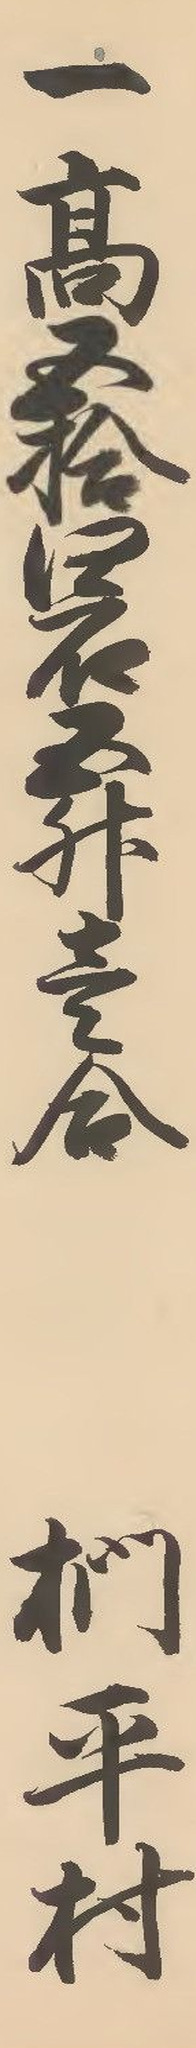一高五拾四石五升壱合椚平村
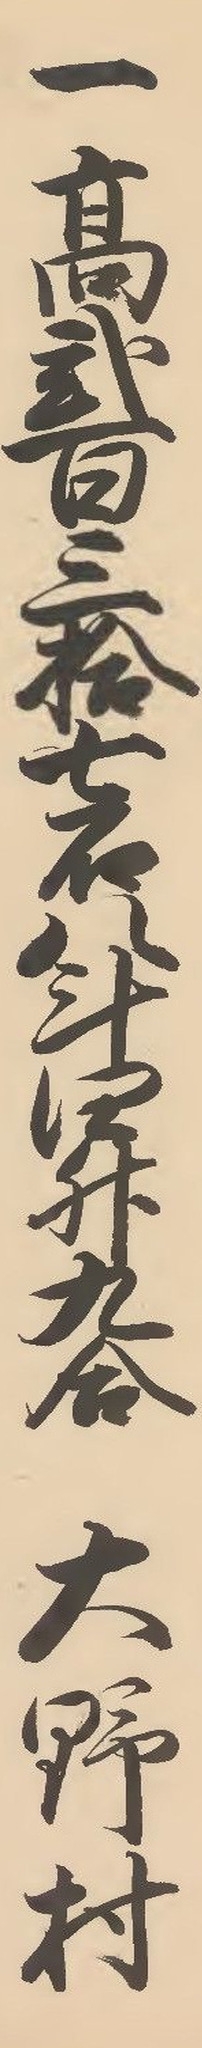一高弐百三拾七石八斗四升九合大野村
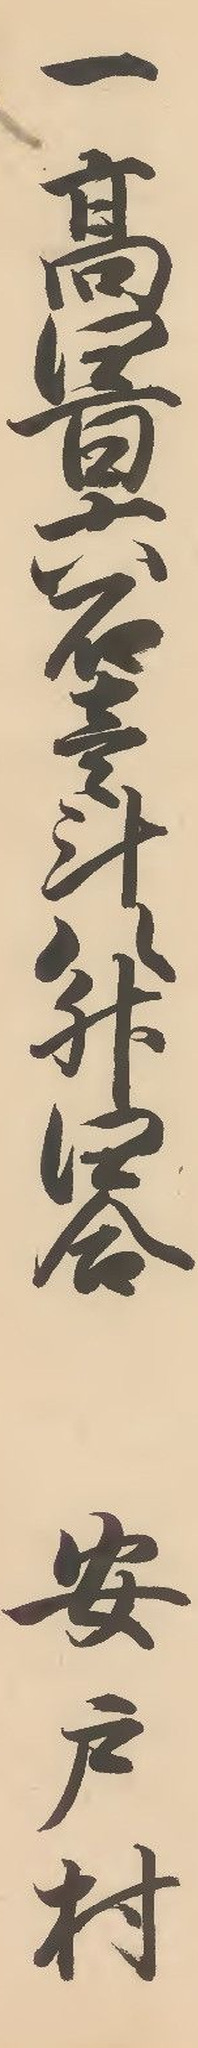一高四百六石壱斗八升四合安戸村

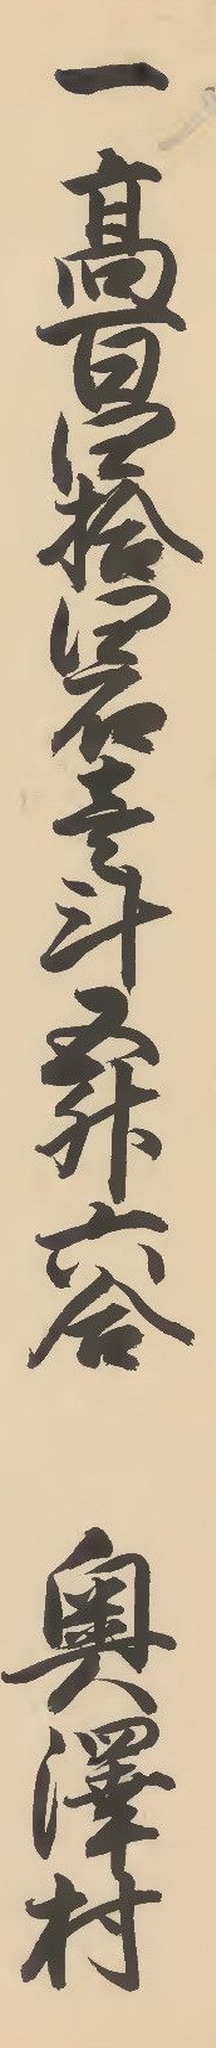一高百四拾四石壱斗五升六合奥澤村
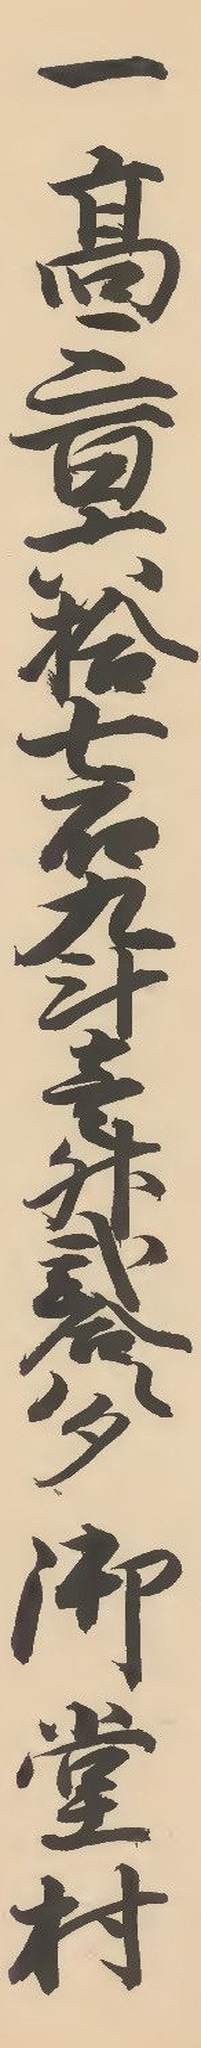一高三百六拾七石九斗壱升弐分八勺御堂村
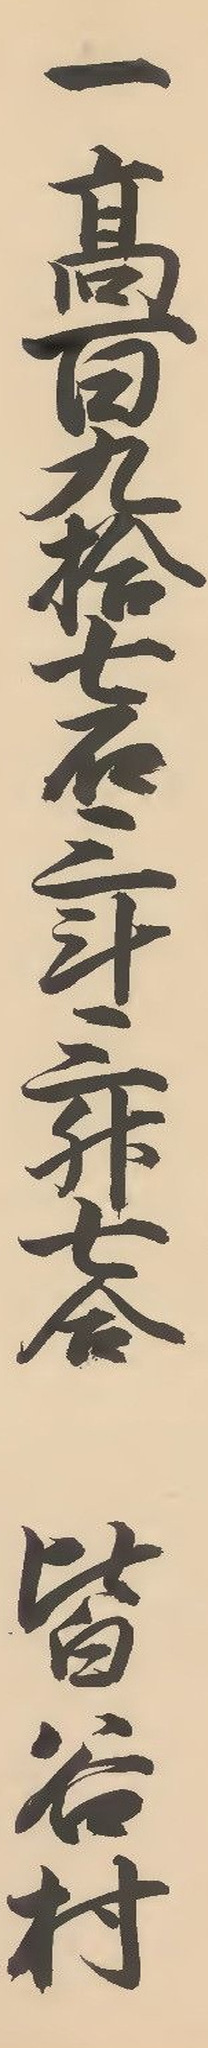一高百九拾七石三斗三升七合皆谷村
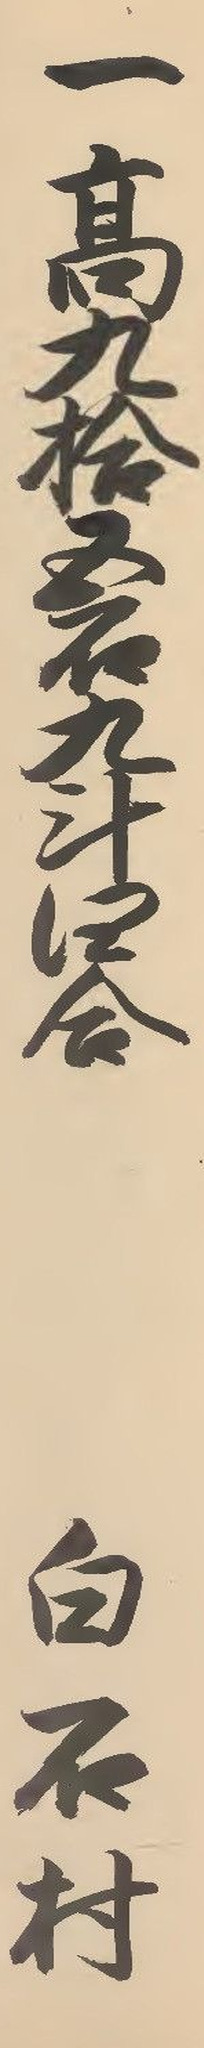一高九拾五石九斗四合白石村
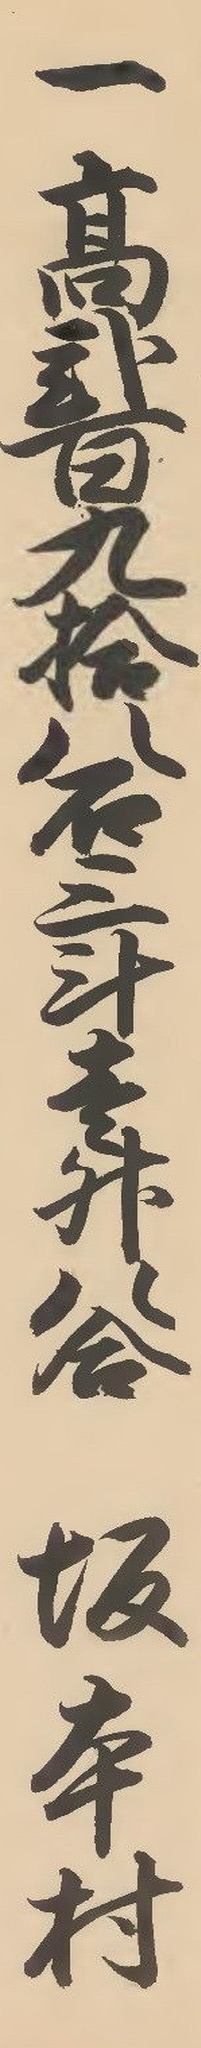一高弐百九拾八石三斗壱升八合坂本村
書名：武蔵国郷帳　上
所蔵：国立公文書館 National Archives of Japan
